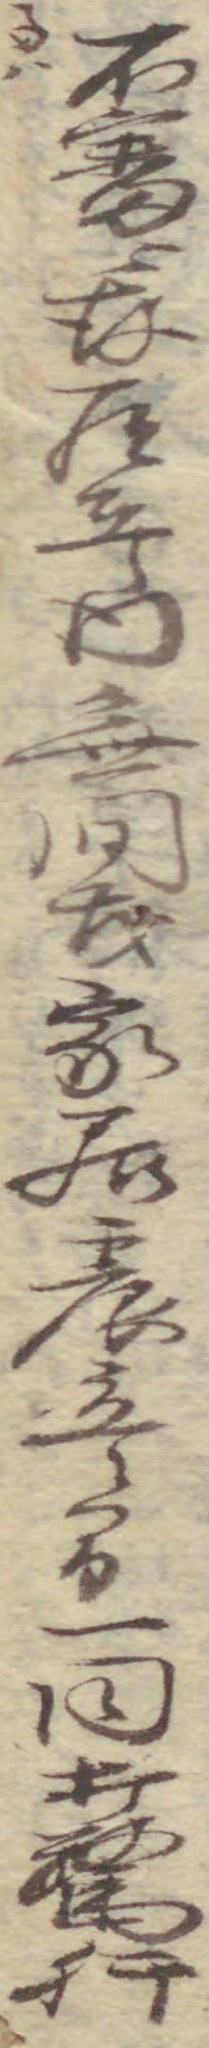不審ニ存罷在候内無間も家居震立候間一同打驚肝
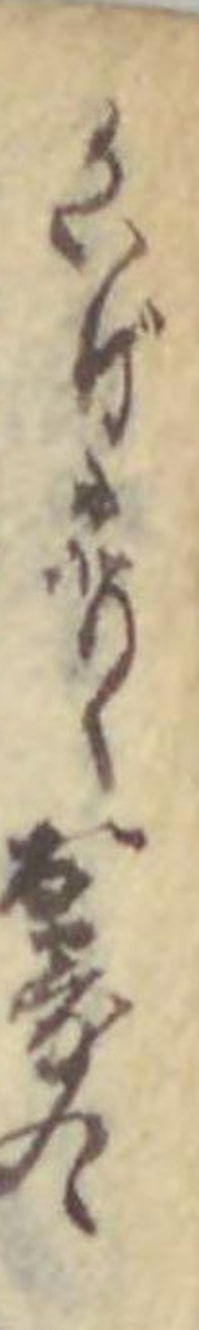かいげに背くお寄合
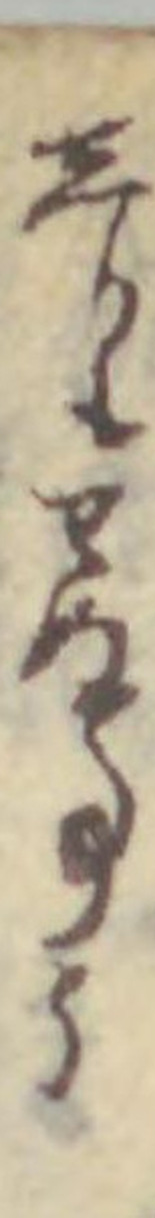しりもせぬ事う
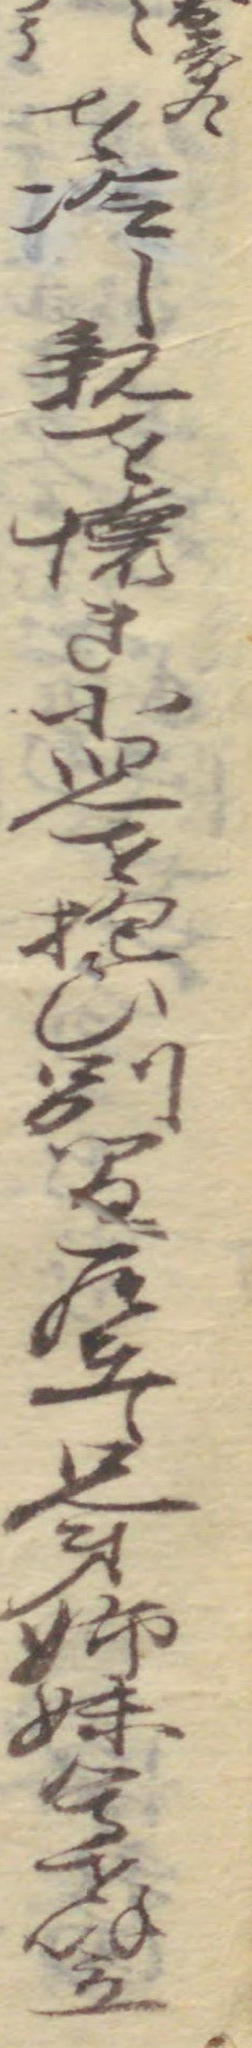を冷し親を懐き小児を抱ひ別間ニ罷在候兄弟姉妹等を呼立
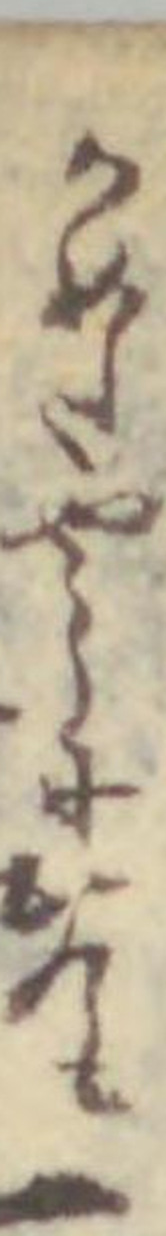かめたやうにおのも
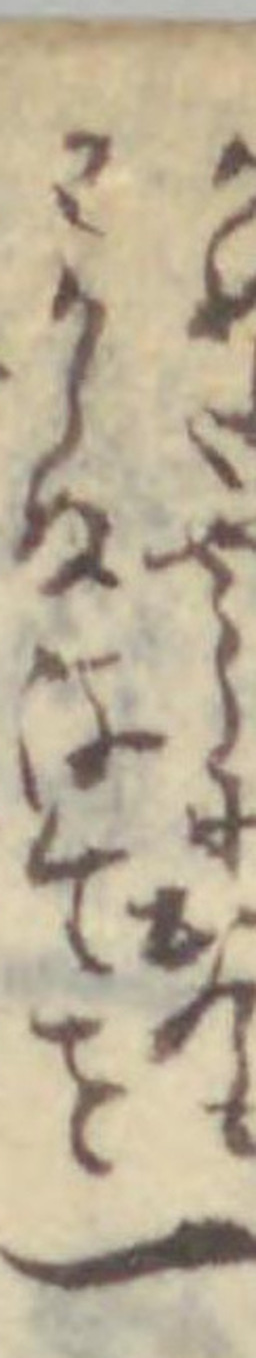わからぬ後生を
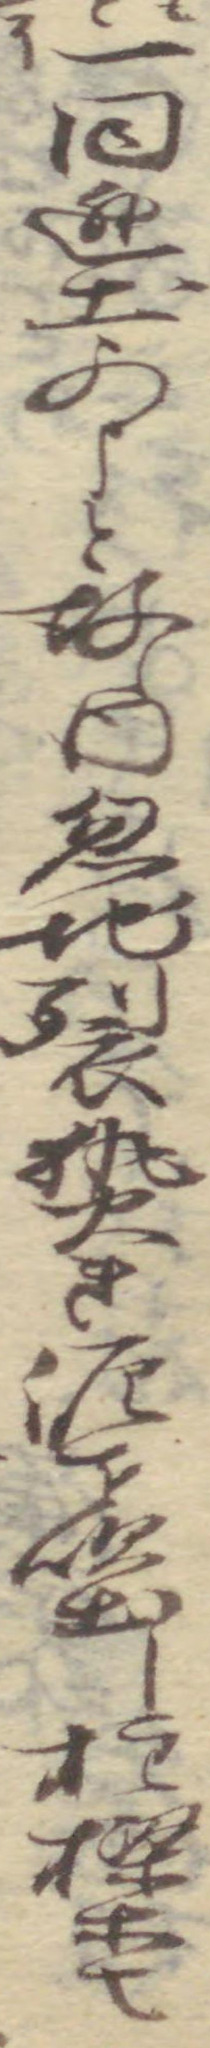一同逃出可申と存候内忽地裂熱き泥を吹出し柱梁等は
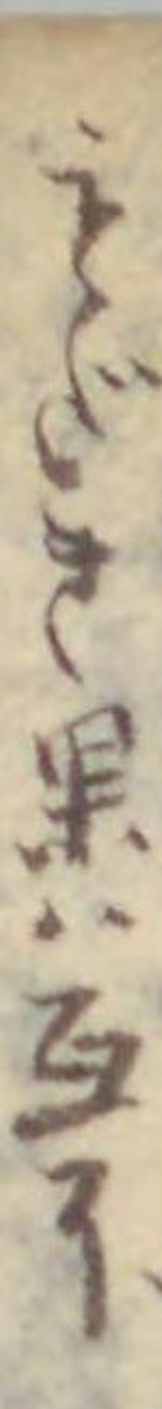もだき果ハ互に
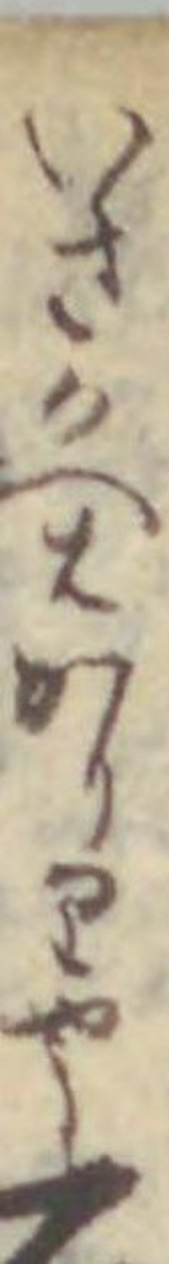いさかへはかりりやう
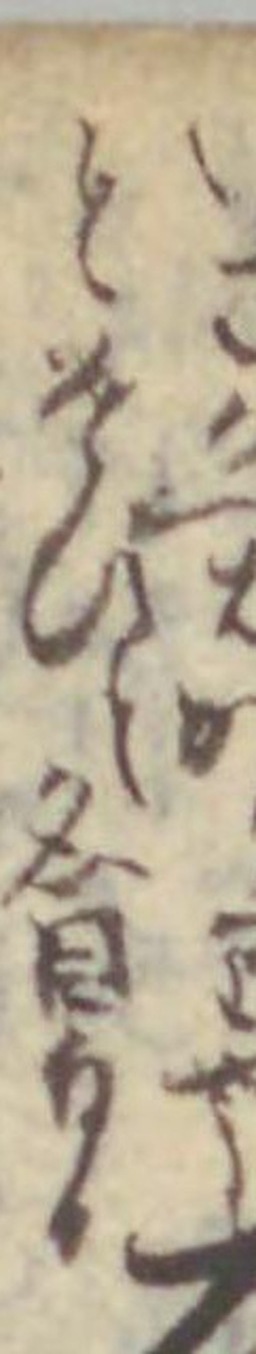と遣ひと名目付る
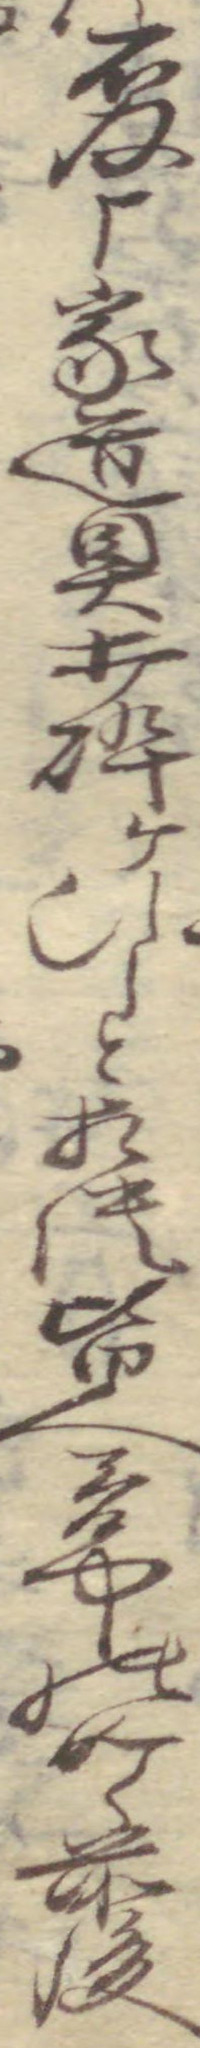不及申家道具打砕ケひしと相潰皆人夢中の如く前後
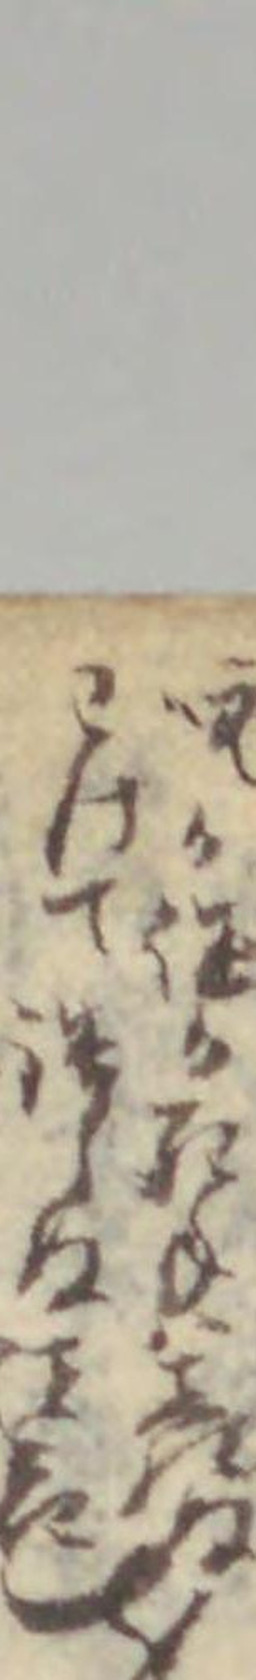わけて詰らぬ法花
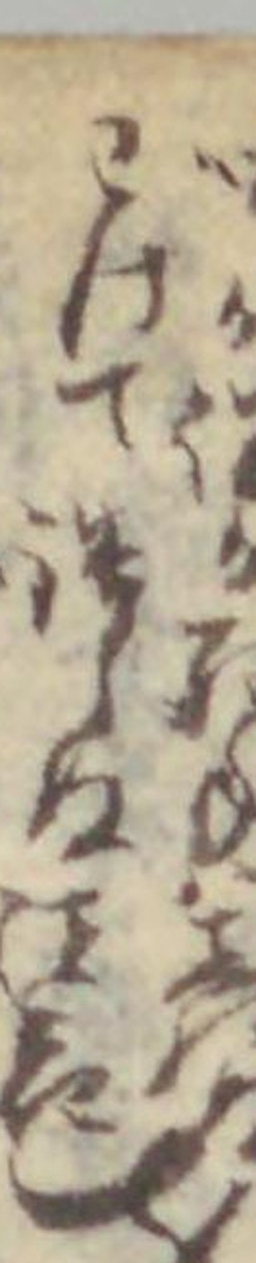わけて詰らぬ法花
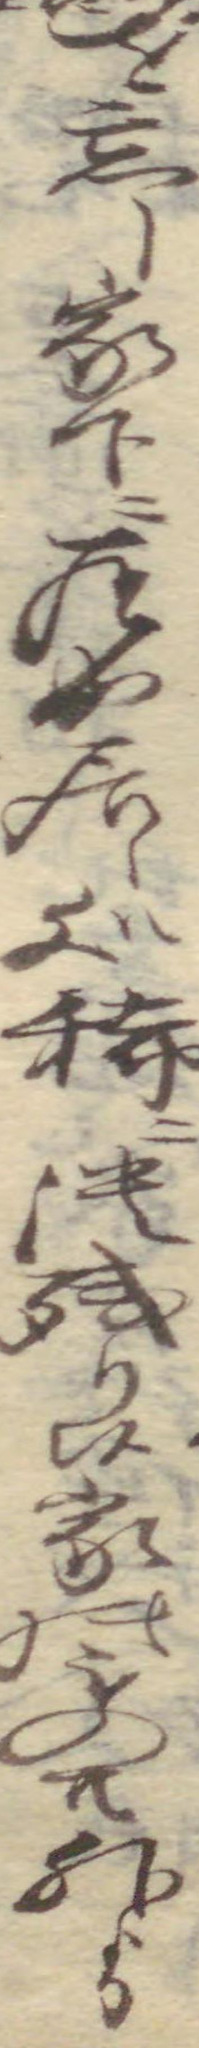を忘し家下ニ罷成居候処稀ニ残り候家のもの共外より
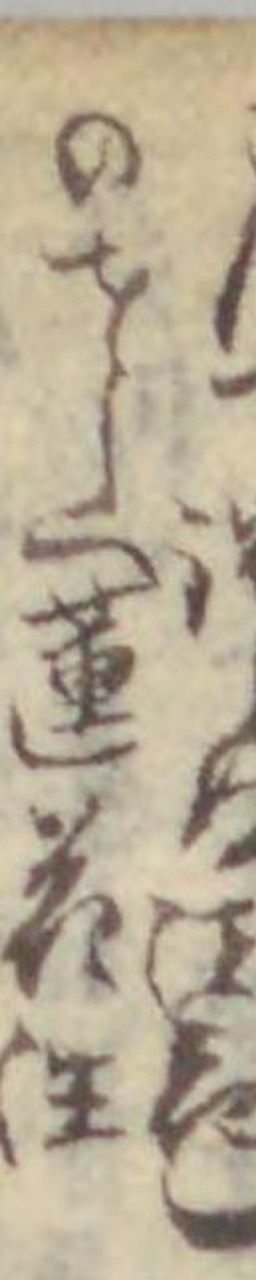のをしへ蓮花往
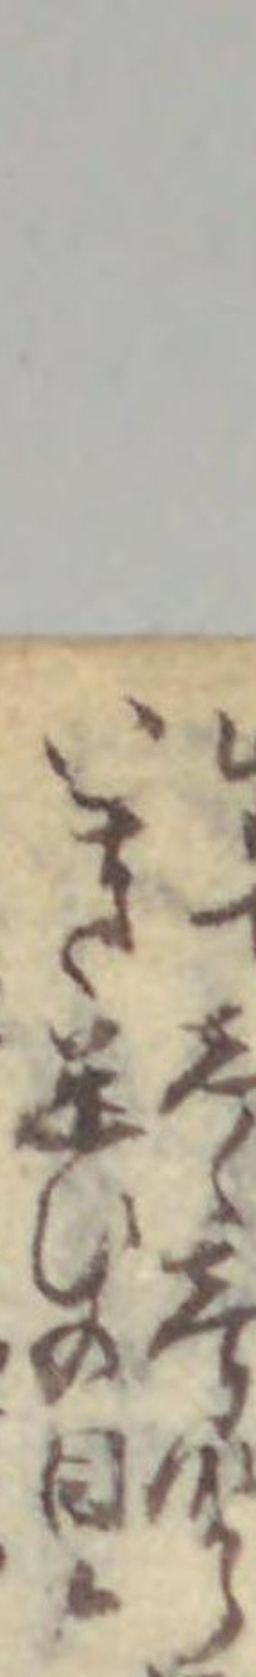いまた迷ひの目か
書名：鶯宿雑記. 巻199-200
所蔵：国立国会図書館 National Diet Library, JAPAN
